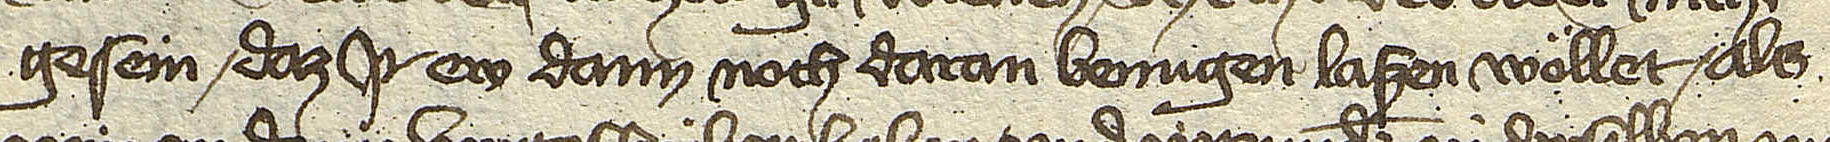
geſein / daʒ Ir ew dann noch daran benugen laſʒen wöllet / als
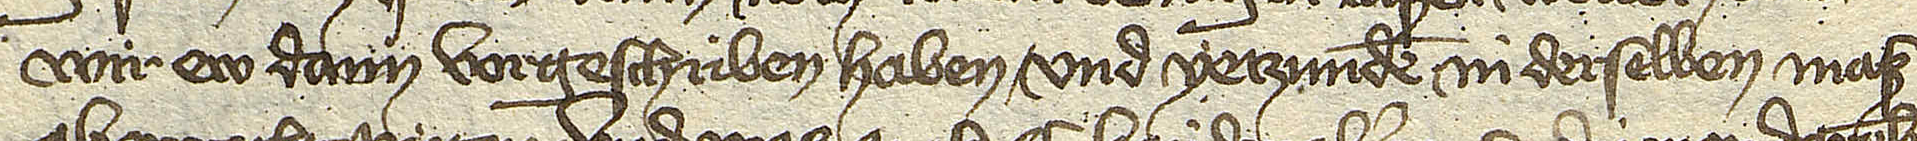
wir ew dann vorgeſchriben haben / vnd yecʒunde* in derſelben maſʒ
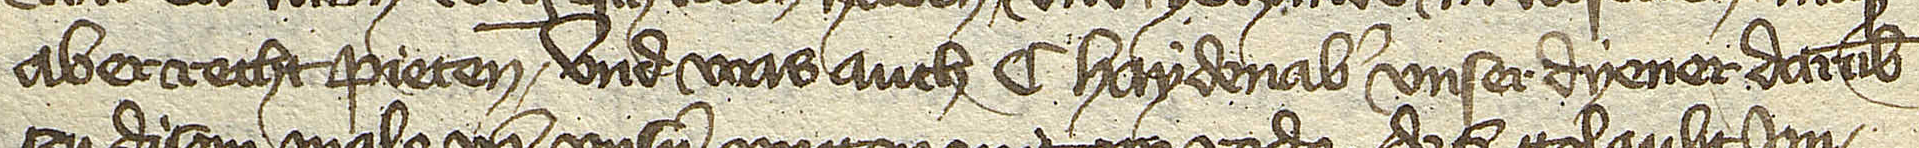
aber recht pieten / Vnd was auch C haydenab* vnſer dyener darub*
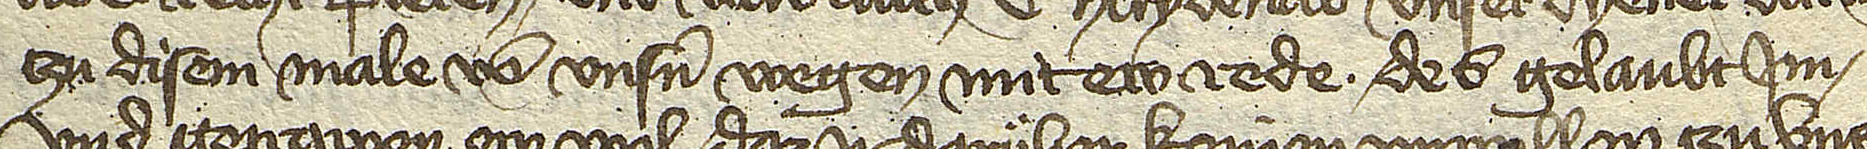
cʒu diſem male vo* vnſn* wegen mit ew rede . / des gelaubt Im /
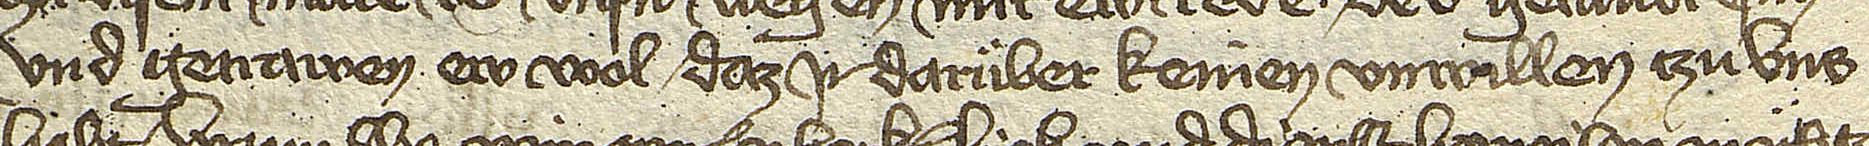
vnd getrawen ew wol / daʒ Ir darüber keinen vnwillen cʒu vns
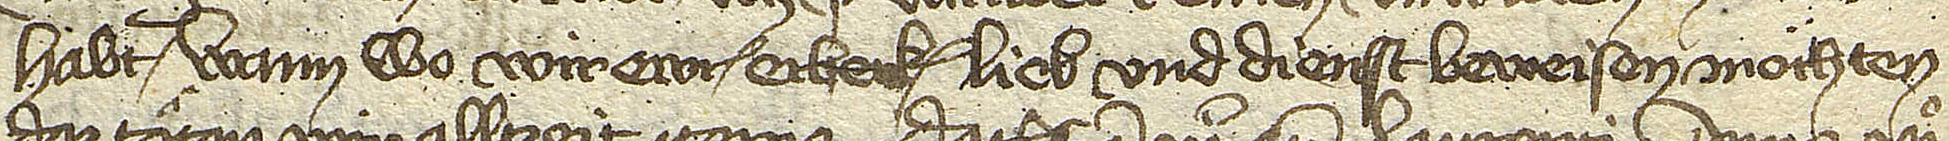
habt / wann wo wir ewr* erberk* lieb vnd dienſt beweiſen möchten
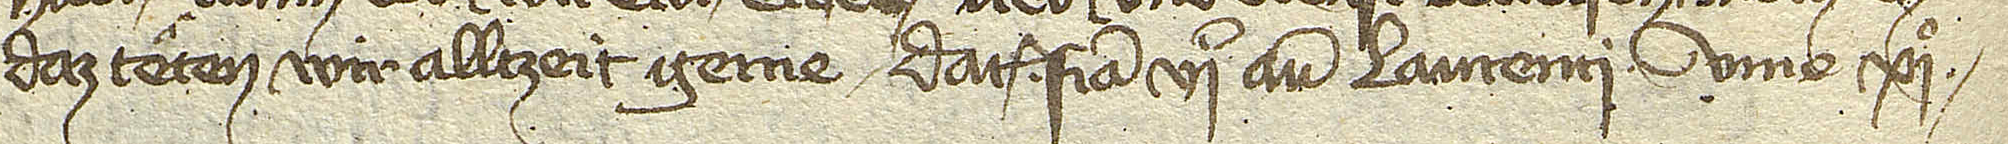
daʒ teten wie allcʒeit gerne / dat* . fia* vi* an* Laurenci Anno xi* . /
